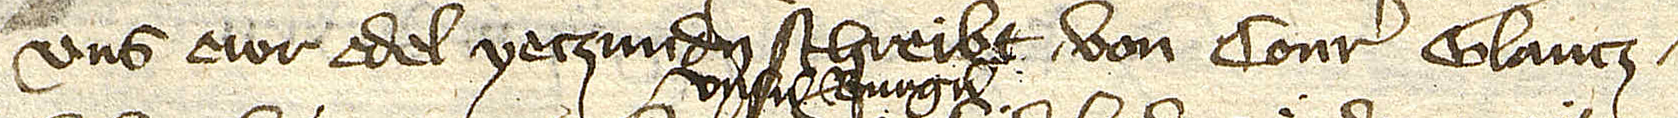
vns ewr edel yecʒundn* ſchreibt von Conr* Glancʒ /
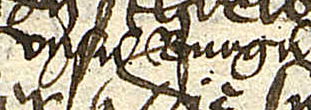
vnſn* Burgn*
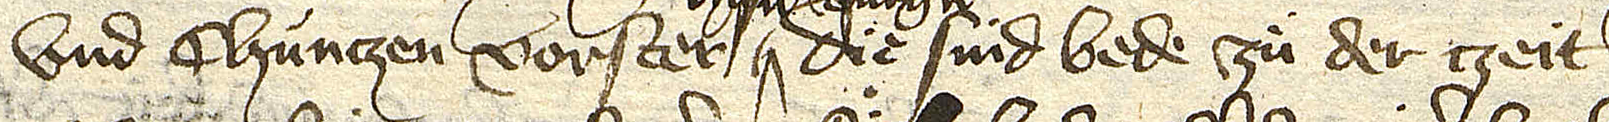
vnd Chüncʒen vorſter / die ſind bede cʒü der cʒeit
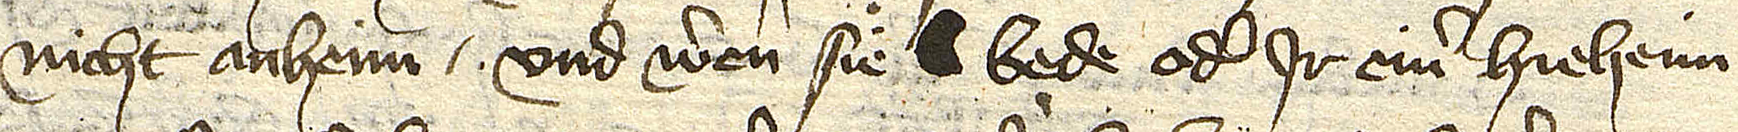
nicht anheim / . vnd wen* ſie % bede od* Ir ein* hieheim
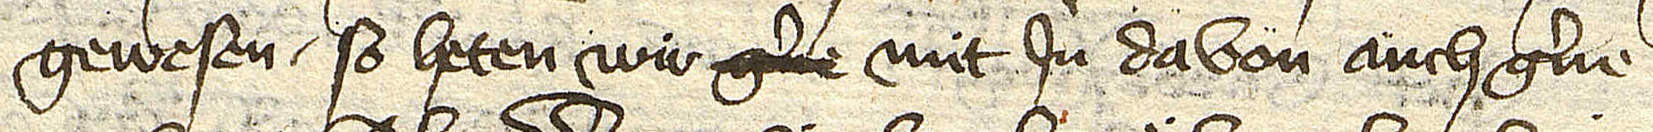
geweſen / ſo heten wir gne* mit In davon auch g*ne
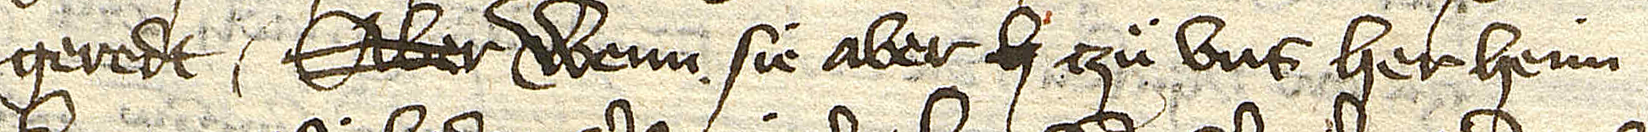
geredt / Aber Wenn ſie aber h cʒü vns her heim
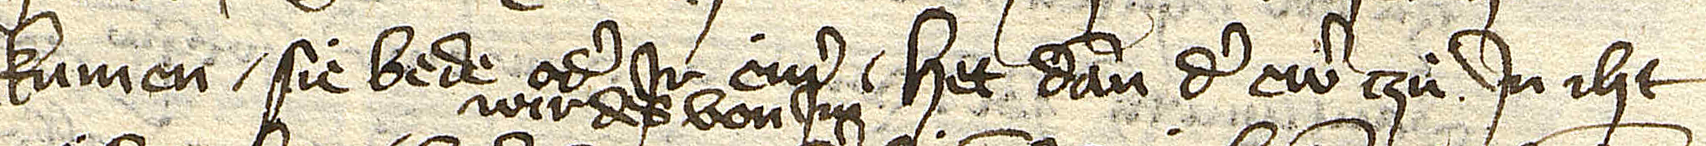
kumen / ſie bede od* Ir ein* / het dan* d* ew* cʒü In iht
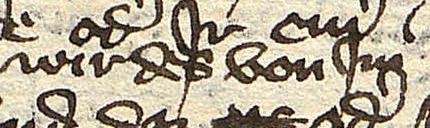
wir des von Im
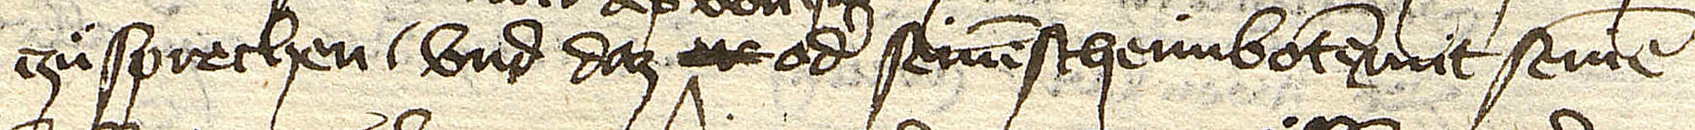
cʒü ſprechen / vnd daʒ er od* ſeine* ſcheimbote* mit ſeine*
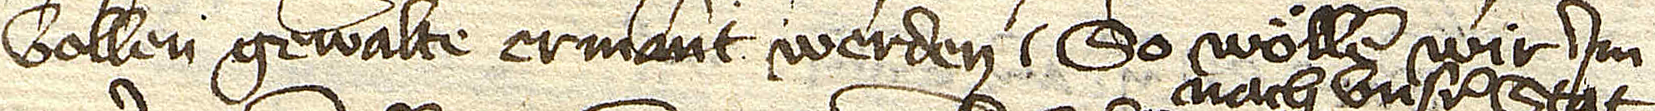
vollen gewalte ermant werden / So wölle* wir Im
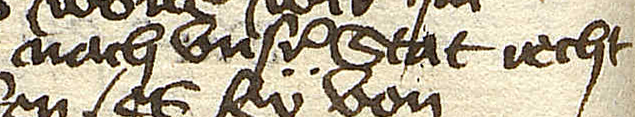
nach vnſr* Stat recht
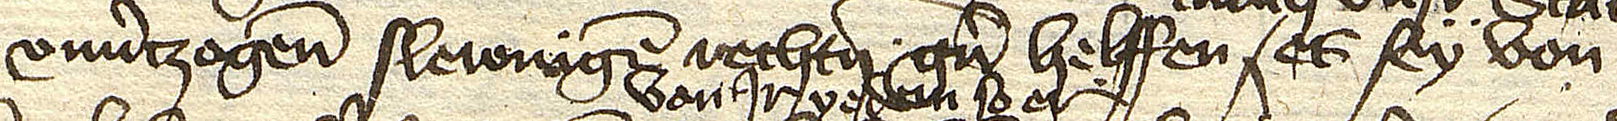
vnu*cʒogen* ſlewnige* rechtn* gn* helffen / es ſey von
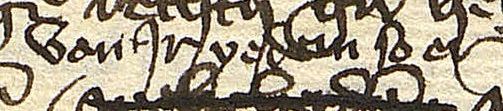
von Ir yedem ſo er
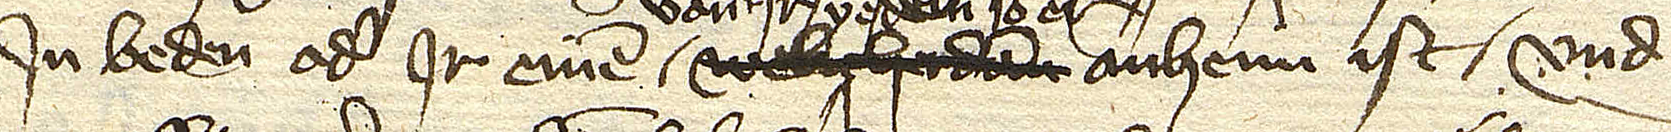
In beden od* Ir eine* welicher dan* anheim iſt / vnd
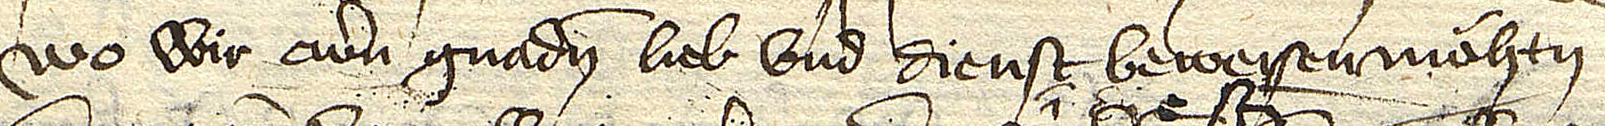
wo wir ewn* gnadn* lieb vnd dienſt beweiſen möhtn*
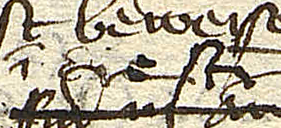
i* die ſci*
